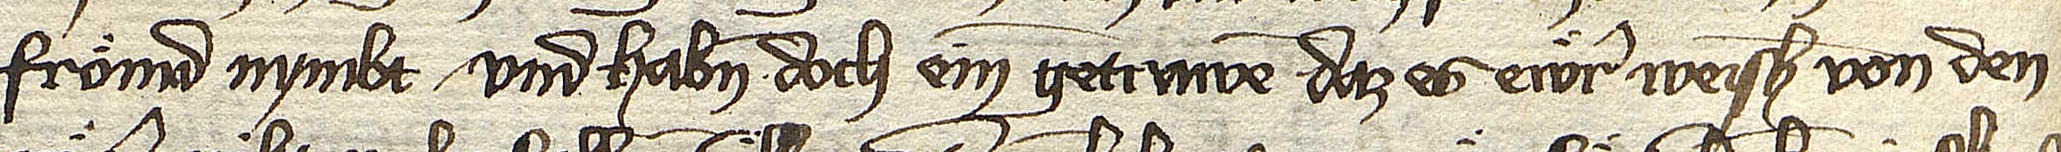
frömd nymbt / vnd habn* doch ein* getrawe* / daʒ es eẅr* weiſh* von den
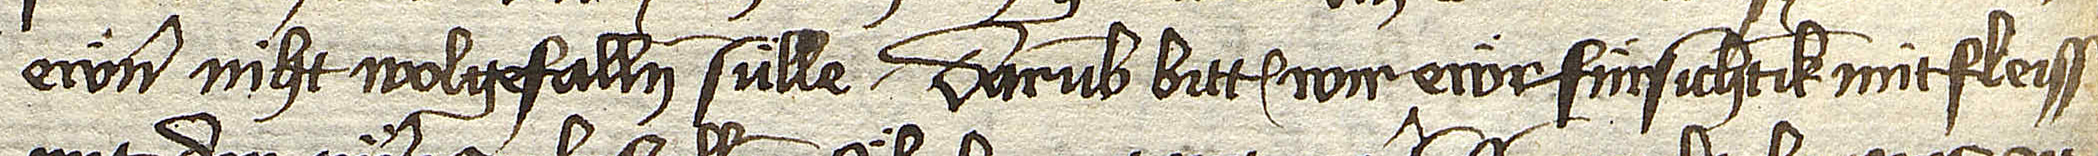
eẅ*n niht wolgefalln* ſülle / Darub* bitt* wir eẅr fürſichtik* mit fleiſſ
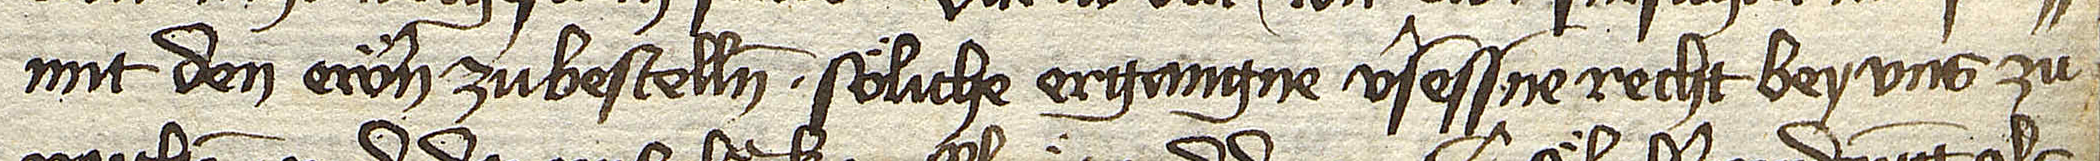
mit den eẅ*n ʒubeſtelln* / ſöliche ergangne v*ſeſſne recht bey vns ʒu
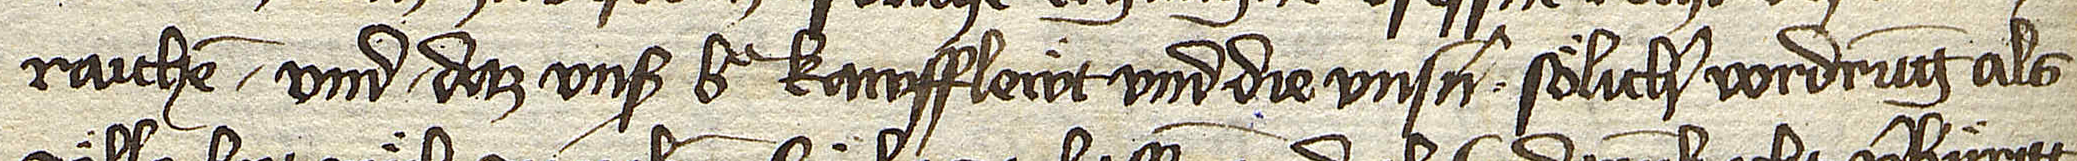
raiche* / vnd / daʒ vnſ* b* kawffleẅt vnd die vnſn* . ſölich* vordru*g als
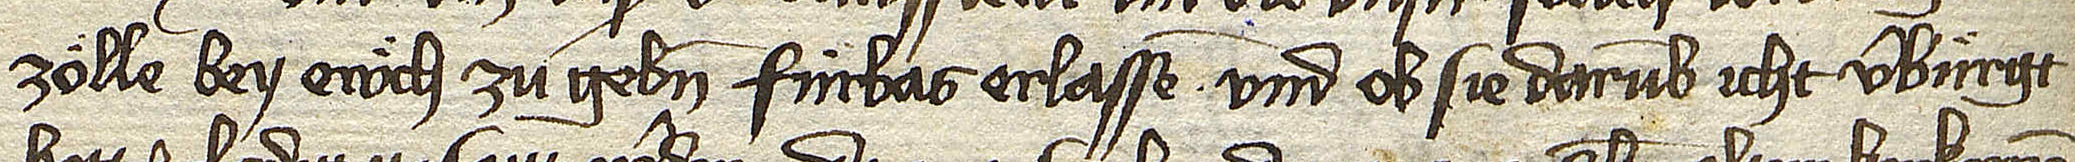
ʒölle bey eẅch ʒu gebn* fürbas erlaſſe* . vnd ob ſie darub* icht v*bürgt
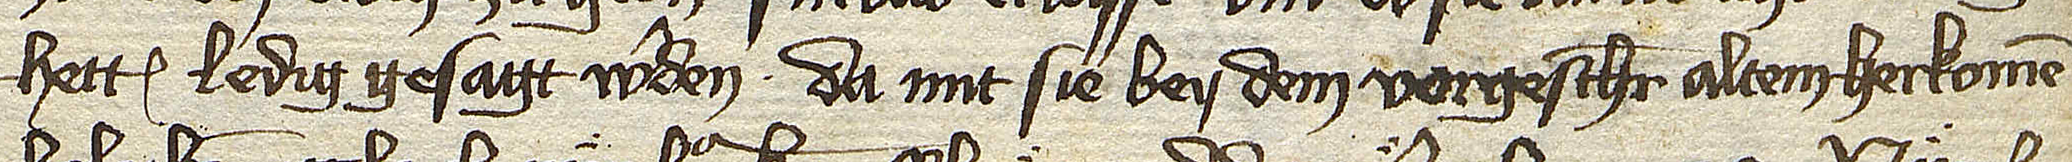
hett* ledig geſagt w*den . Da mit ſie bey dem vorgeſchr* altem herkome*
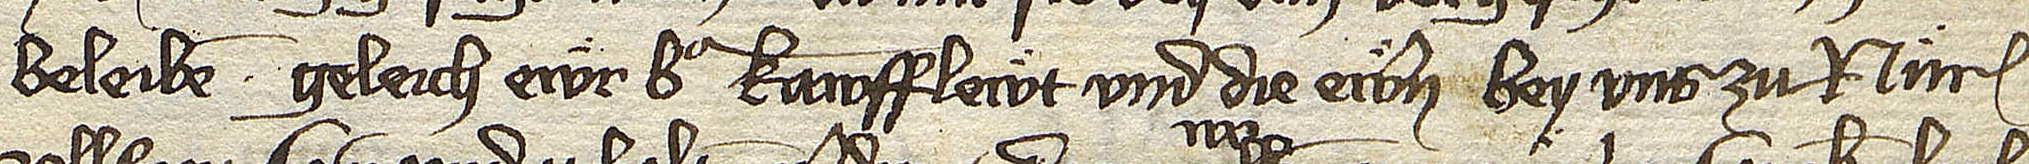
beleibe* . geleich eẅr b* kawffleẅt vnd die eẅ*n bey vns ʒu Nür*
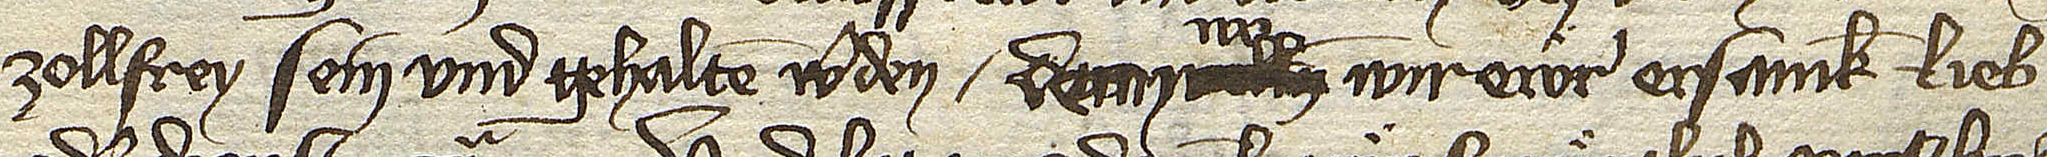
ʒollfrey ſein vnd gehalte* w*den / Denn welln* wir eẅr* erſamk* lieb
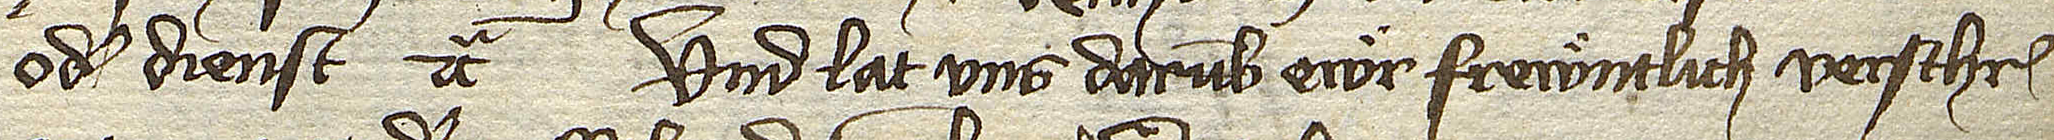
od* dienſt ec* Vnd lat vns darub* eẅr freẅntlich verſchr*
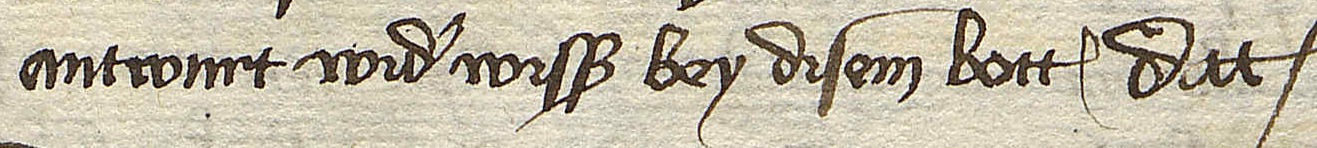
antwurt wid* wiſſ* bey diſem bott* Dat*
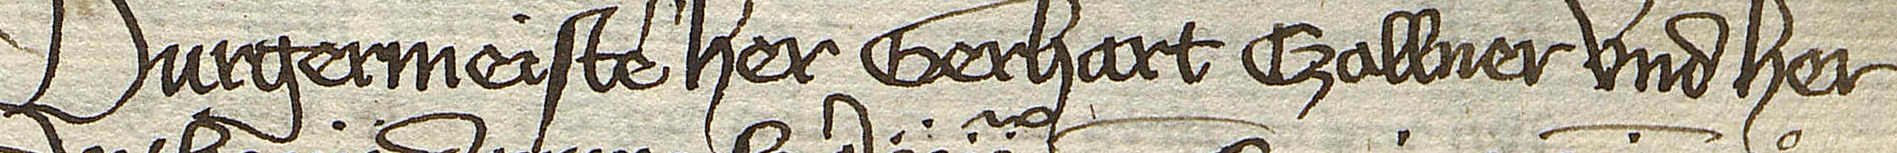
Burgermeiſte* her Gerhart Cʒollner Vnd her
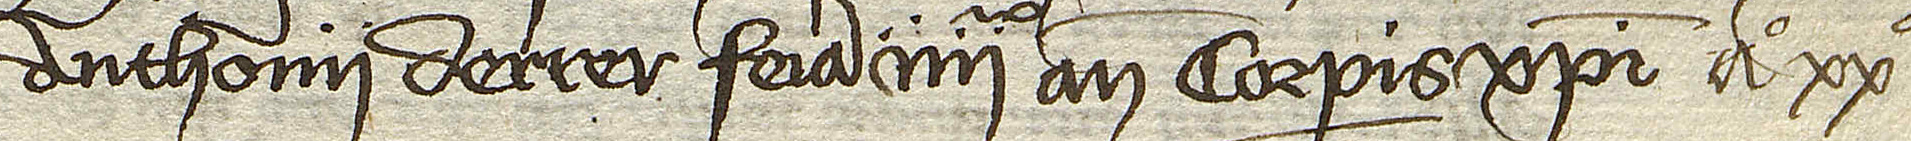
Anthonii Derrer feia* iiii* an* Corp*is xpi* a* xx*
